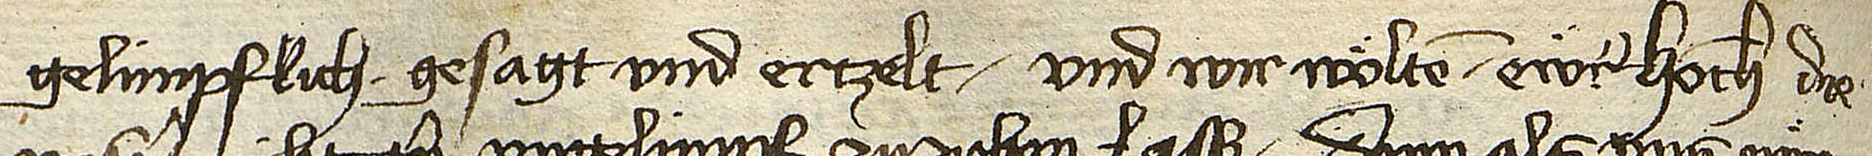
gelimpflich . geſagt vnd ercʒelt / vnd wir wölte* / eẅr* Hoch* die
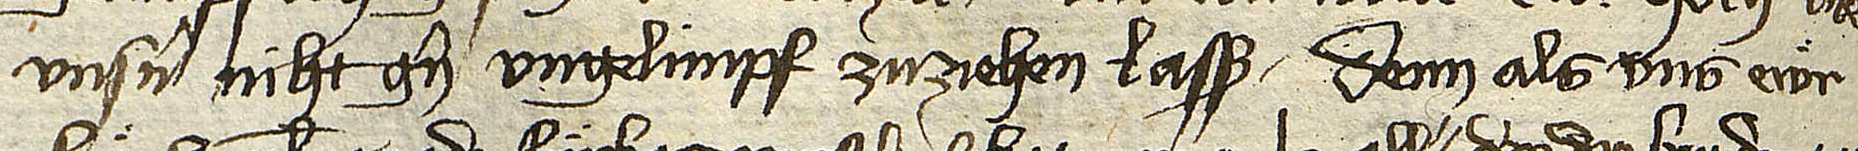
vnſ*n niht gn* vngelimpf ʒuʒiehen laſſ* / Denn als vns eẅr
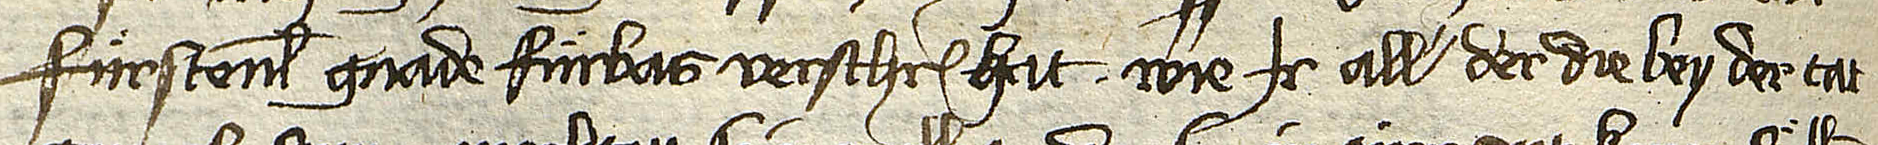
fürſtenl* gnade fürbas verſchr* hat . wie Ir all* der die bey der tat
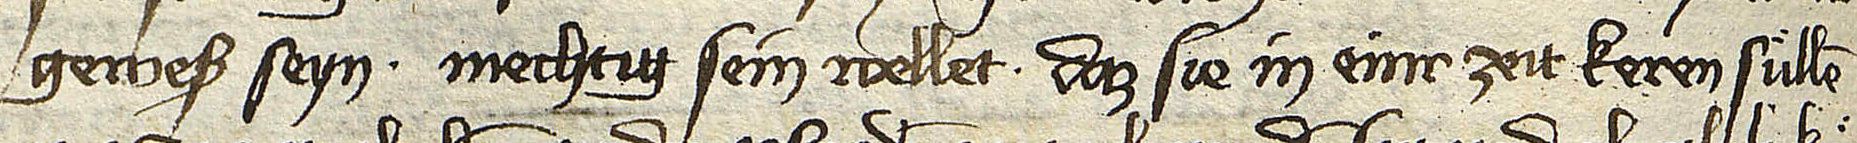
geweſ* ſeyn . mechtig ſein wellet . daʒ ſie in einr ʒeit keren ſülle*
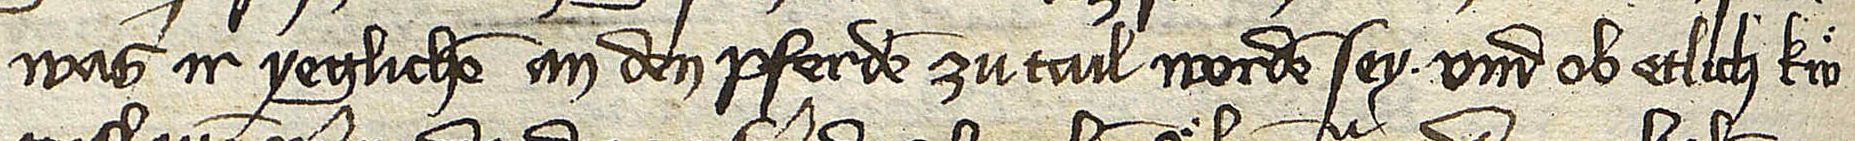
was ir yegliche* an den pferde* ʒu tail worde* ſey . vnd ob etlich kẅ
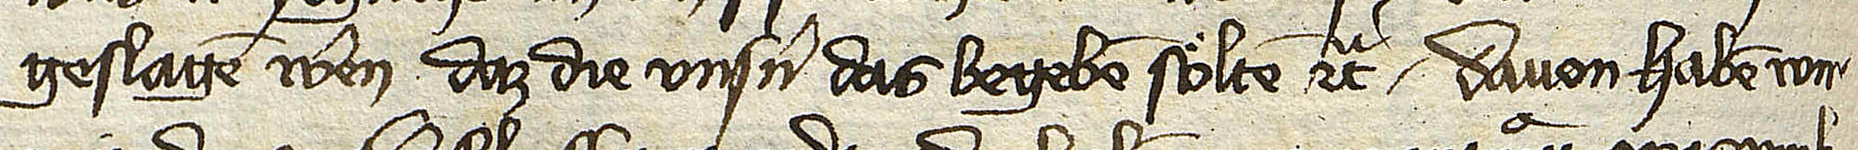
geſlage* wen* . daʒ die vnſ*n das begebe* ſölte* ec* / Dauon habe* wir
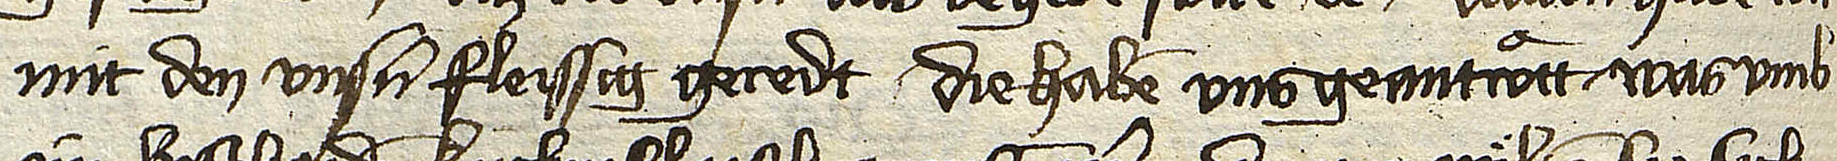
mit den vnſn* fleiſſig geredt / die habe* vns geantw*tt / was vmb
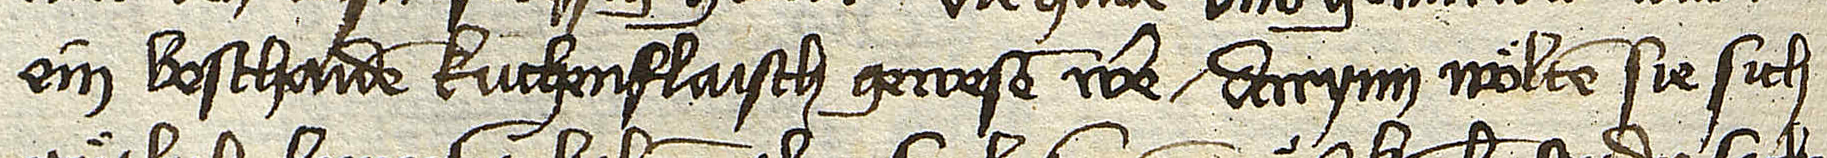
ein beſchaide* kuchenflaiſch geweſe* we* / darynn wölte* ſie ſich
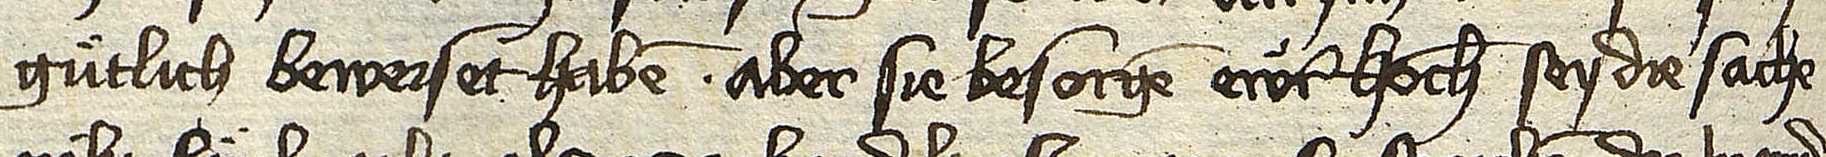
gütlich beweiſet habe* . aber ſie beſorge* eẅr* hoch* ſey die ſache
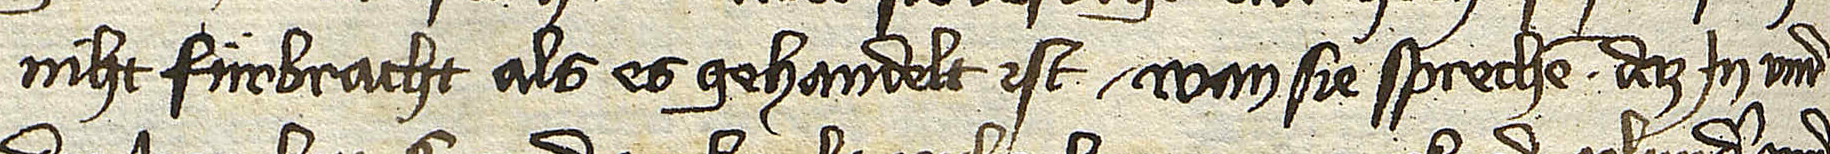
niht fürbracht als es gehandelt iſt / wan ſie ſpreche* . daʒ In vnd
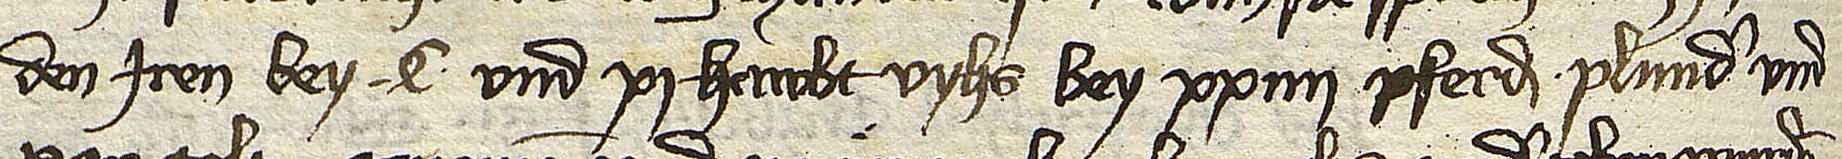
den Iren bey . C . vnd xi hawbt vyhs bey xxiiii pferd* . plund* vnd
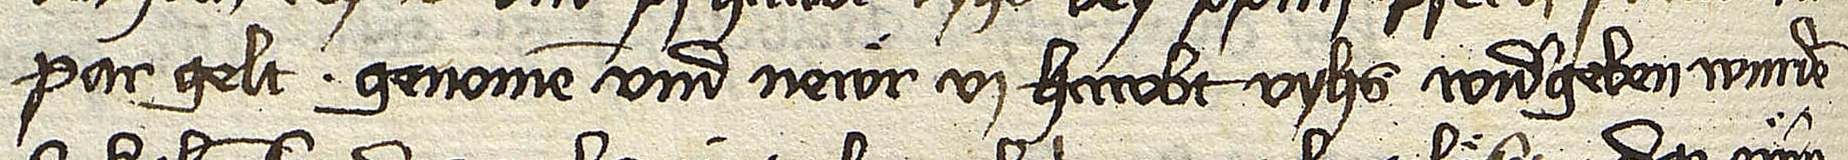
Par gelt . genome* vnd neẅr vi hawbt vyhs wid*geben wurde*
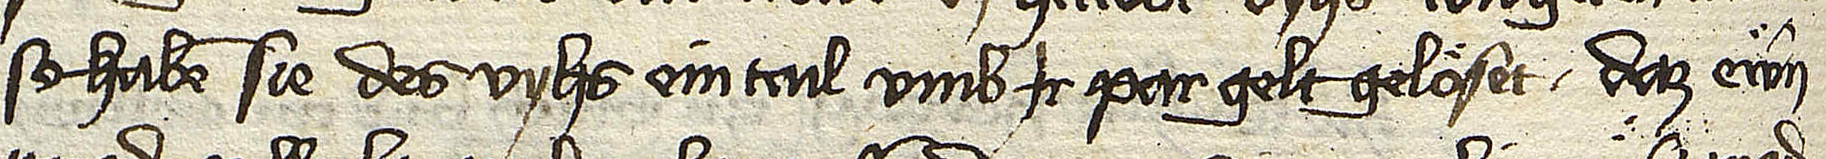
ſo habe* ſie des vyhs ein tail vmb Ir Par gelt gelöſet / daʒ eẅn*
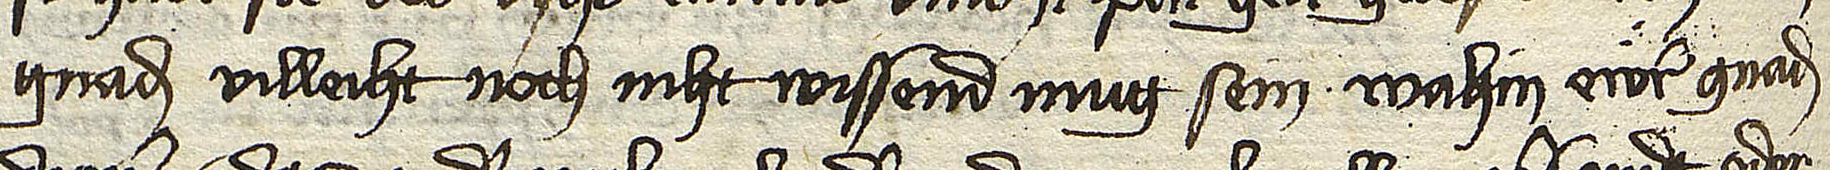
gnad* villeicht noch niht wiſſend mug ſein . wahin eẅr* gnad*
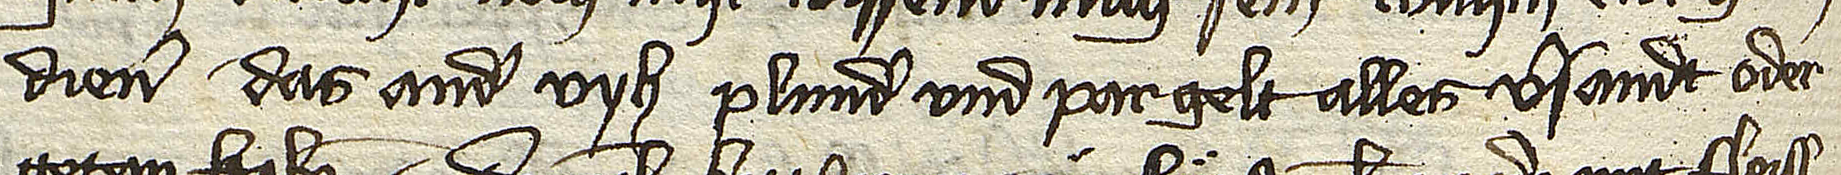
dien* / das and* vyh plund* vnd par gelt alles v*ſandt oder
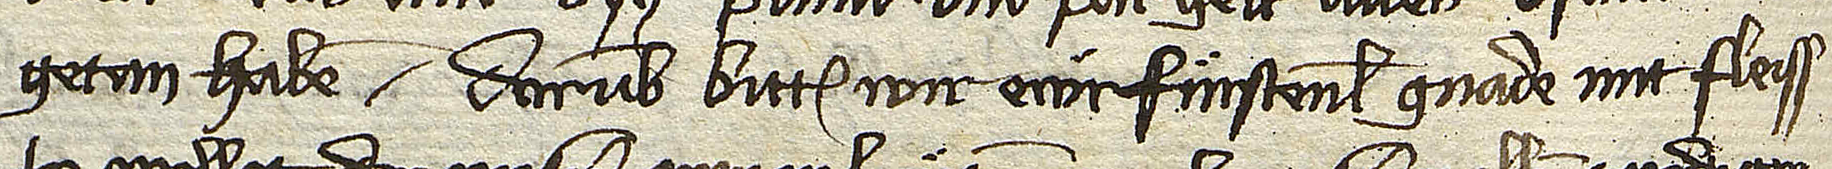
getan habe* / Darub* bitt* wir eẅr fürſtenl* gnade mit fleiſſ
